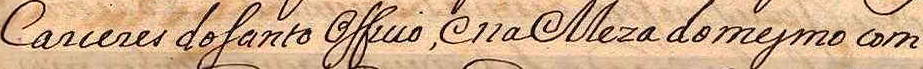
Carceres do santo Officio, e na Meza do mesmo com
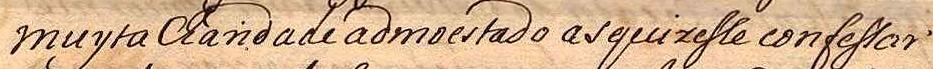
muyta charidade admoestado as quizesse confessar
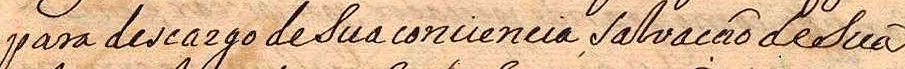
para descargo de Sua conciencia, salvaçaõ de Sua
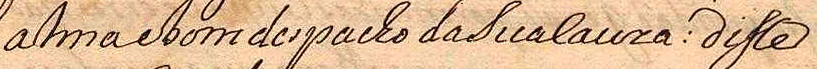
alma e bom despacho da Sua Cauza: disCe
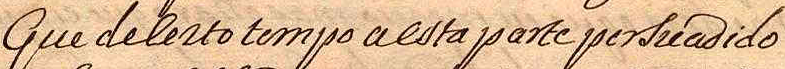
Que de Certo tempo a esta parte persuadido
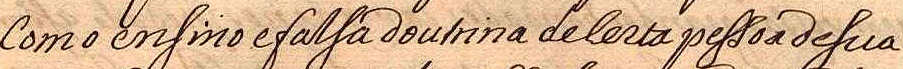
Com o ensino e falsa doutrina de Certa pessoa de sua
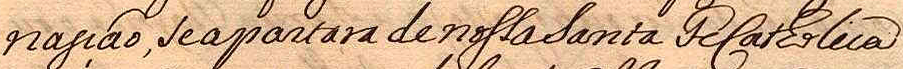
nasção, se apartara de nossa Santa Fe Catholica
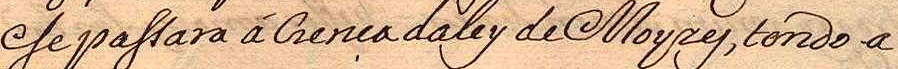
e se passara á Crença da ley de Moyzes, tendo-a
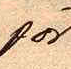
por
